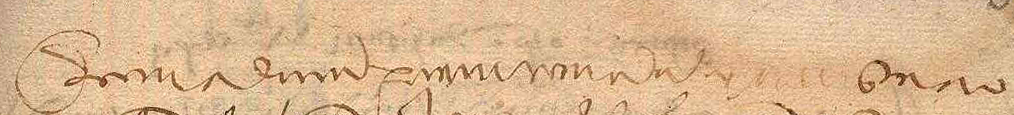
E com a dita ꝑçam tomada dey a uista ao
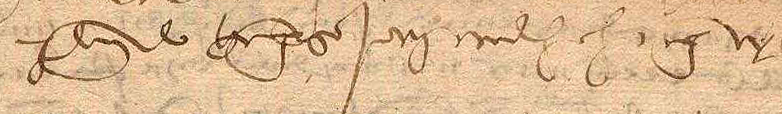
ꝑdor do Reo p̄so Joam coelho ho sp̄vy
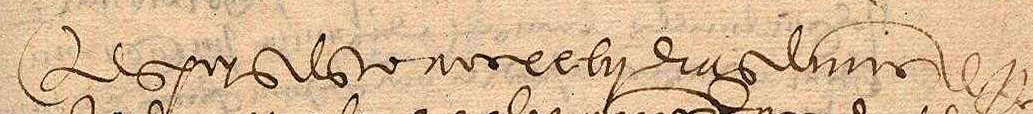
E despoys desto aos xxbij dias do mes de fe
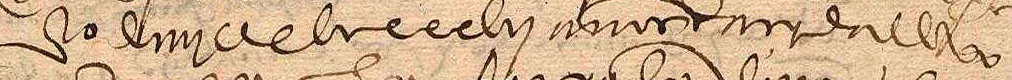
vro de mjll e bc xxxbij anos ē a cydade devo
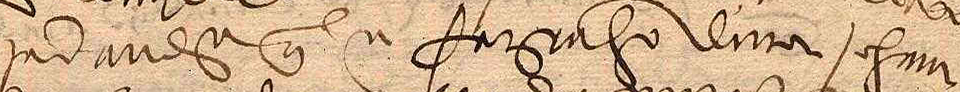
ra ē audja q̄ hi fazya ho doutor Joham
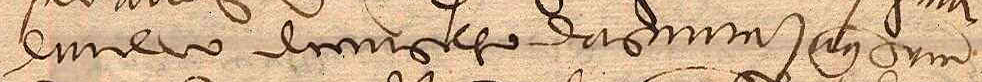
de mello de comselho da santa Jnq̄syçā
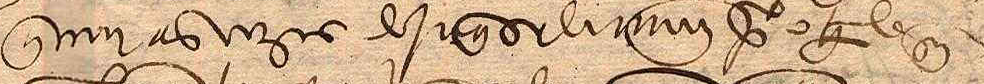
q̄ tem as vezes do Jnq̄sydor moor p̄o o Rdo s̄r
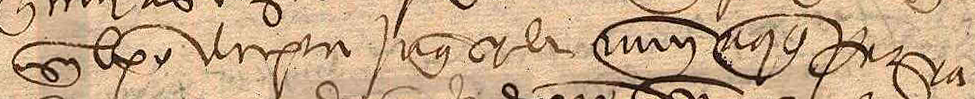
o s̄r bp̄o de cepta Jnq̄sydor mor a q̄ll fazya
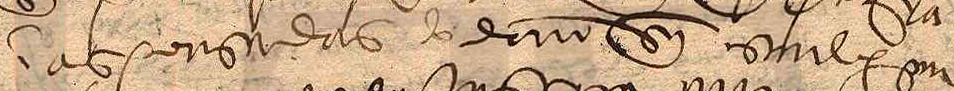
ē as pousadas do dito s̄or estando ꝑsem
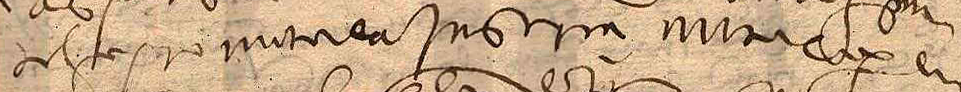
te ho promotor da Justyça autor e o ꝑdor
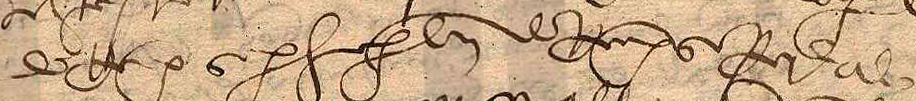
do Reo p̄so ꝑ ho ꝑdor do Reo p̄so foy dado
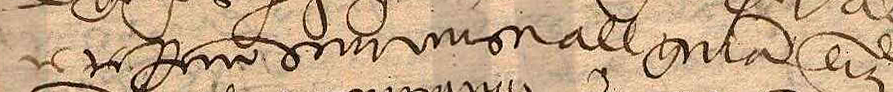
este fct̄o sem cousa allguā dizdo
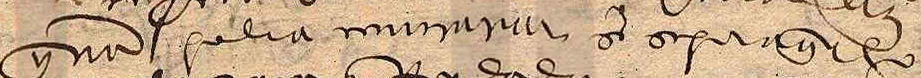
q̄ nā podia comtrariar sē se por aq̄y ho
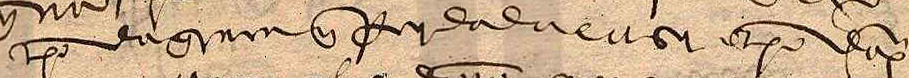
tp̄o da graça q̄ foy dada e asy o tp̄o da p̄
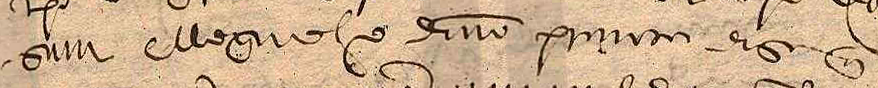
sam e lloguo ho dito promotor dise q̄
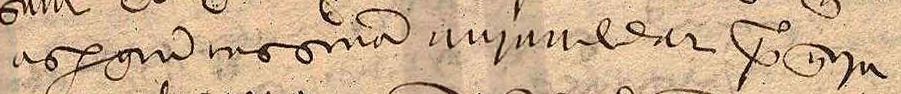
as ꝑ gūtas se nā aujam de dar p̄oq̄ era
